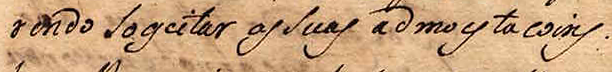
rendo sogeitar as suas admoestaçoins.
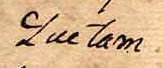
Que tam
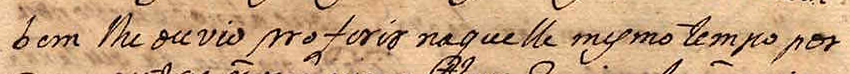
bem lhe ouvio proferir naquelle mesmo tempo por
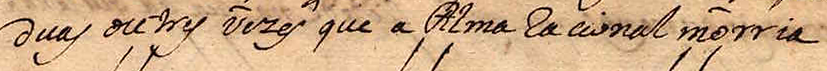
duas ou tres vezes que a Alma Racional morria
